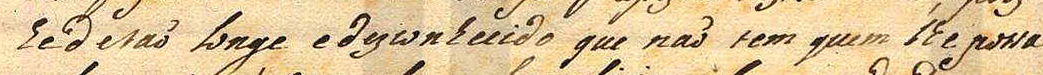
he de taõ longe e dezconhecido que naõ tem quem lhe possa
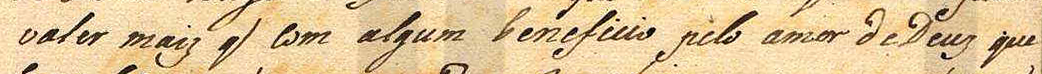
valer maiz q̄ com algum beneficio pelo amor de Deuz que
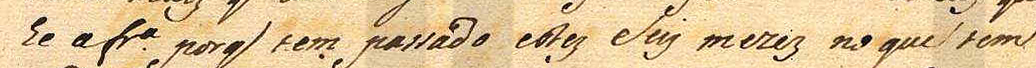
he a fr.a porq̄ tem passado estez seiz mezez no que tem
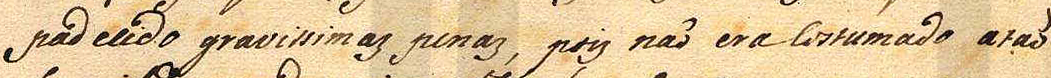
padecido gravissimaz penaz, poiz naõ era costumado a taõ
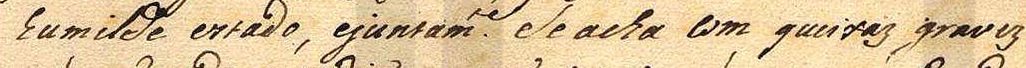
humilde estado, e juntam.te Se acha com queixaz gravez
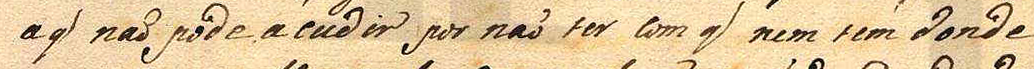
a q̄ naõ pode acudir por naõ ter com q̄ nem tem donde
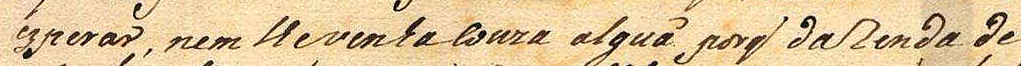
ezperar, nem lhe venha couza alguā porq̄ da Renda de
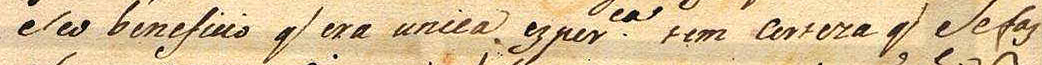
seo beneficio q̄ era unica ezper.ça tem certeza q̄ se faz
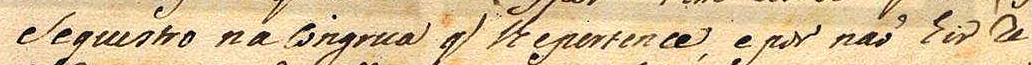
sequestro na congrua q̄ lhe pertence, e por naõ hir Re
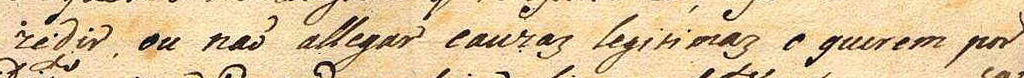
zidir, ou naõ allegar cauzaz legitimaz o querem por
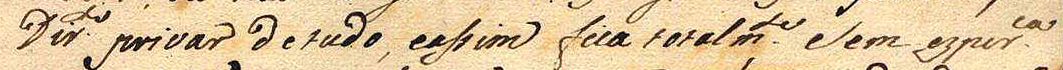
Dir.to privar de tudo, e assim fica totalm.te sem esper.ça
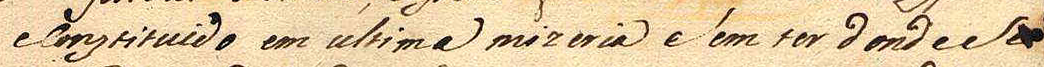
e conztituido em ultima mizeria sem ter donde se
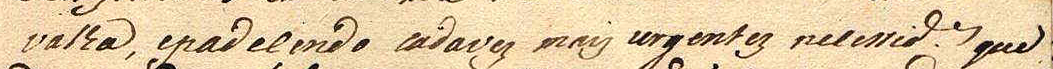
valha, e padecendo cada vez maiz urgentez necessid.es que
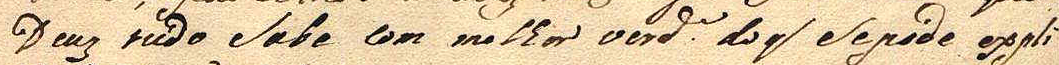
Deuz tudo Sabe com melhor verd.e do q̄ se pode expli
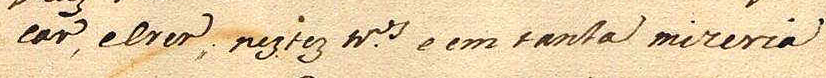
car, e crer, neztez tr.os e em tanta mizeria
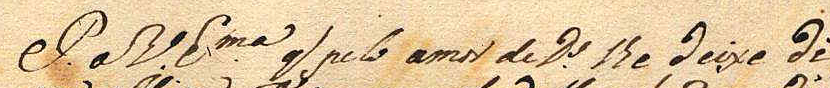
P. a V. E.ma q̄ pelo amor de D.s lhe deixe di
